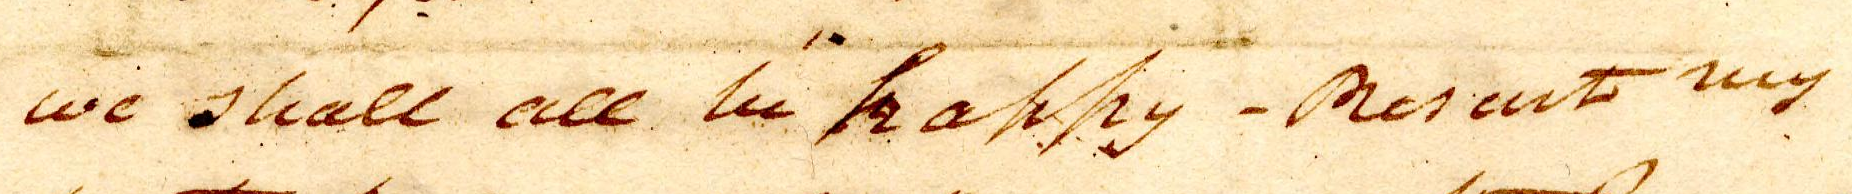we shall all be happy- Rescent my
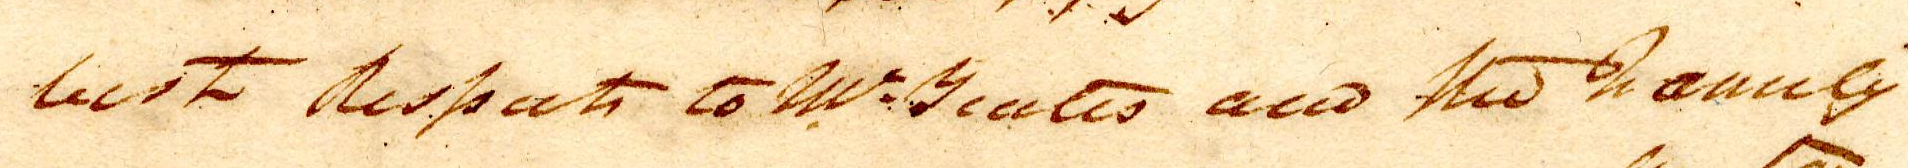best Respects to M^rs. Yeates and the family
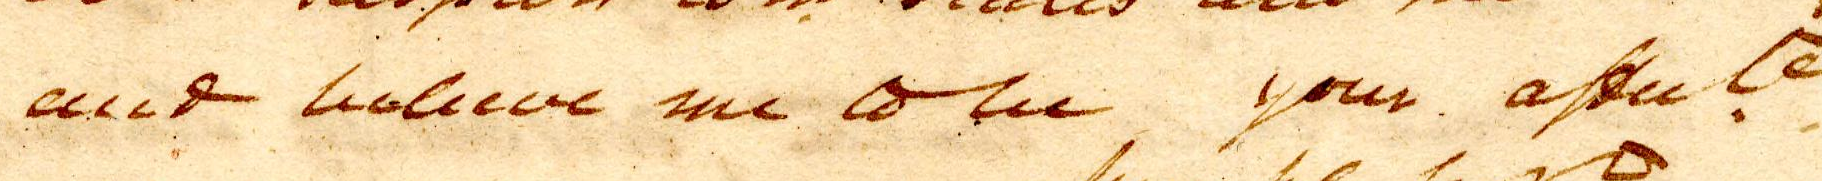and believe me to be, your affect^e.
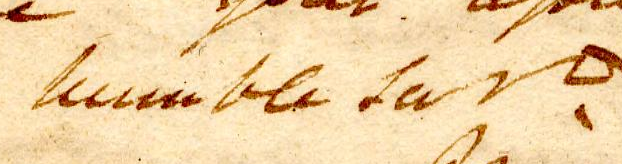humble Serv^t.
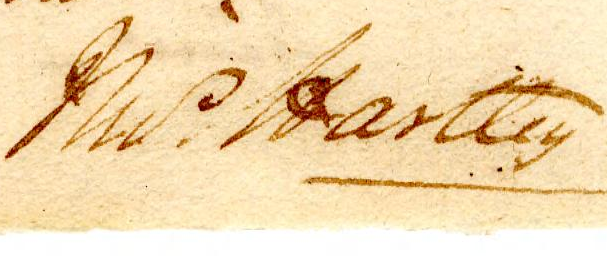Tho^s. Hartley
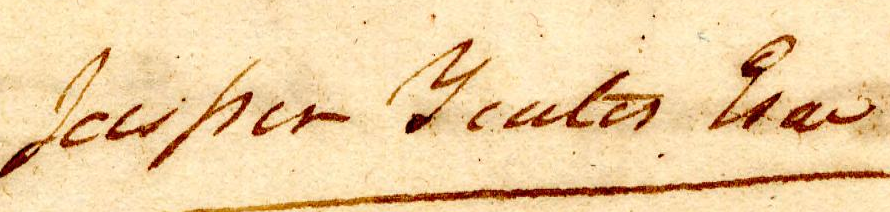Jasper Yeates Esq^r.
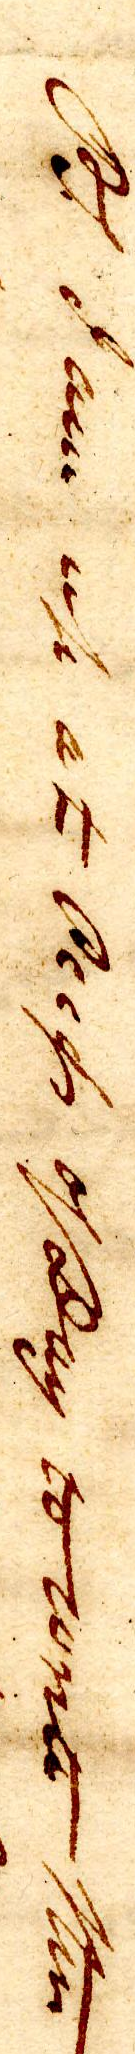PS I am up at Peed of Day to write this
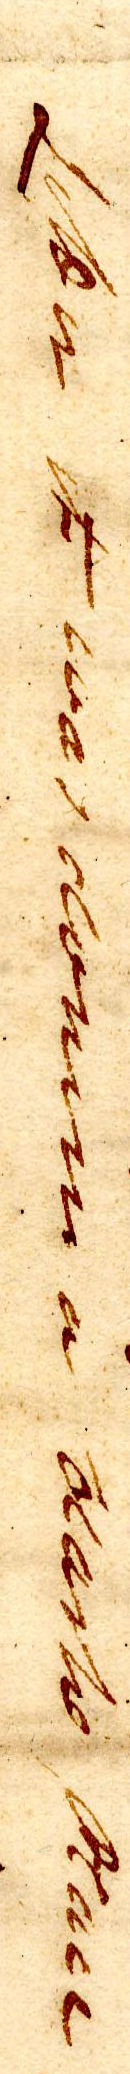Letter it was down a dark Place
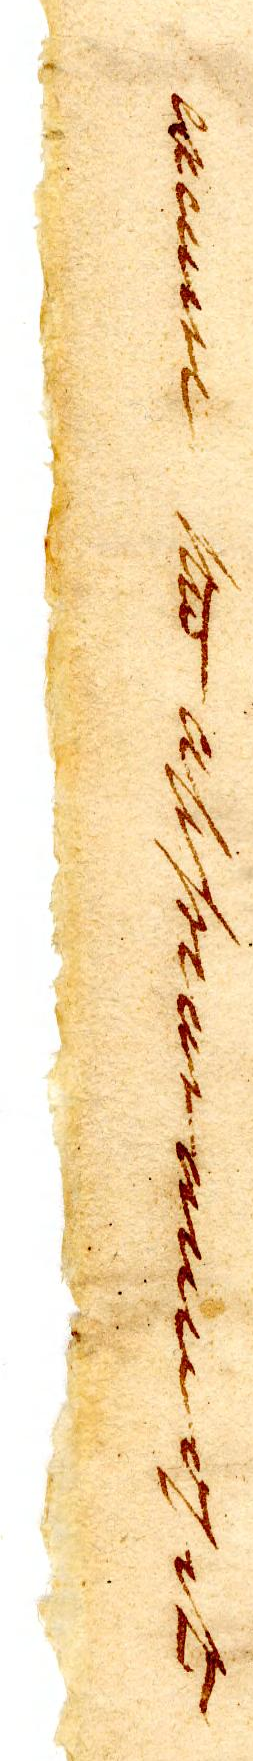excuse the appearance of it
